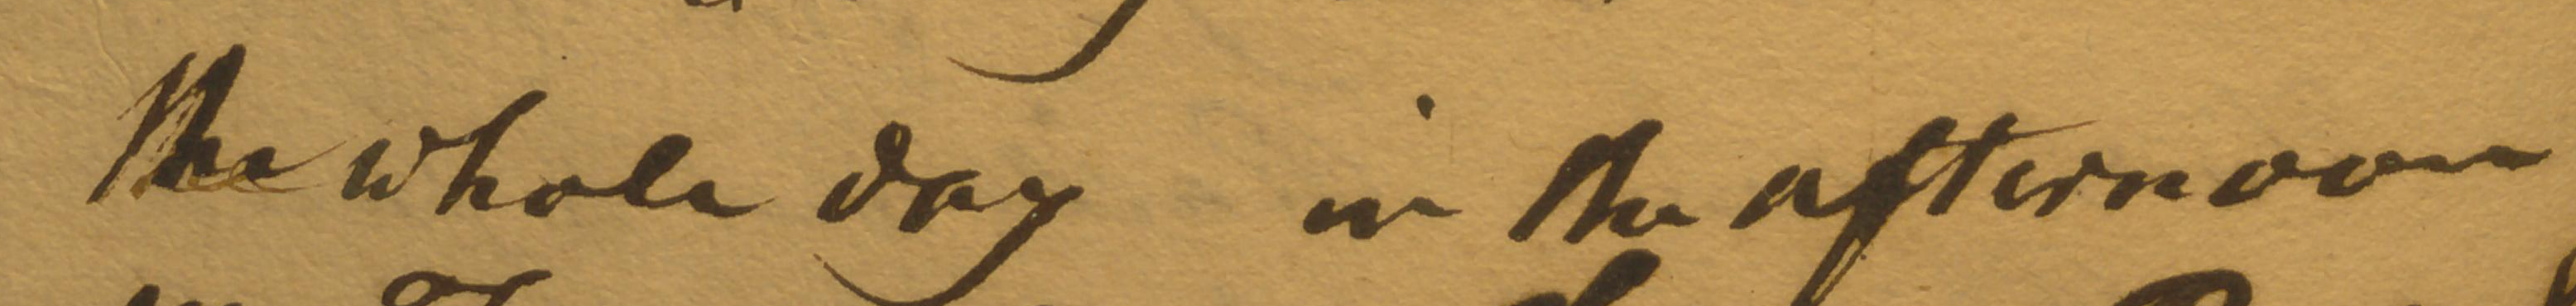the whole day in the afternoon
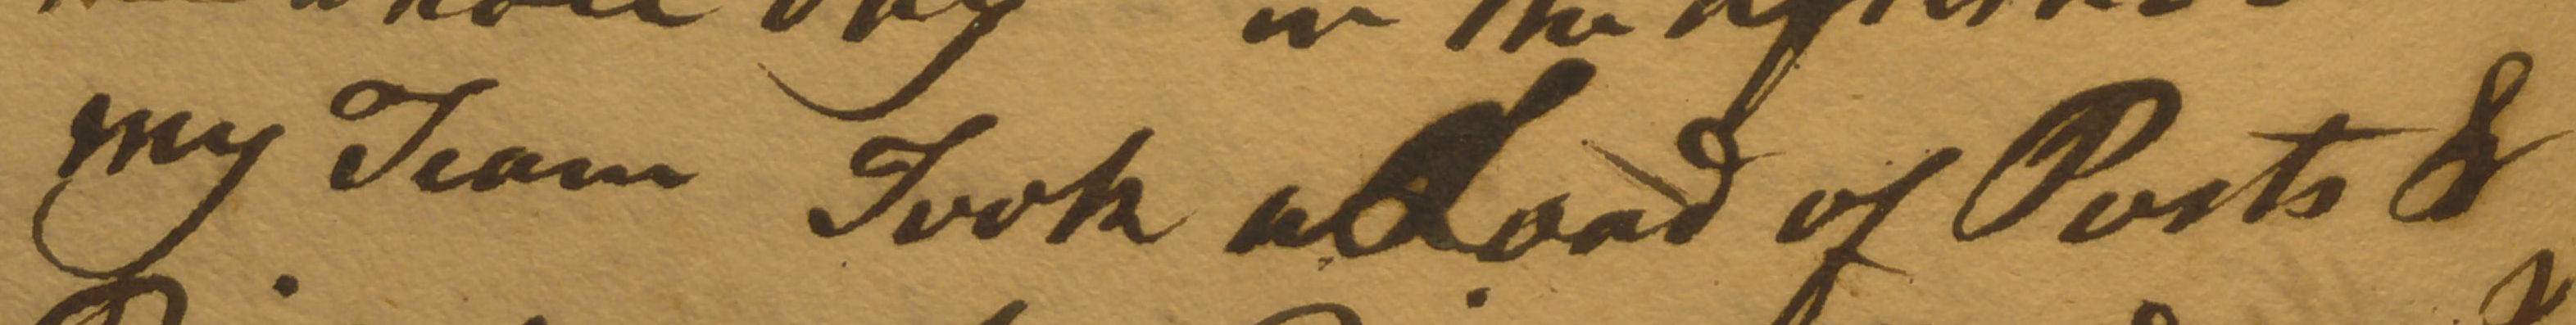My Team Took a Load of Posts &
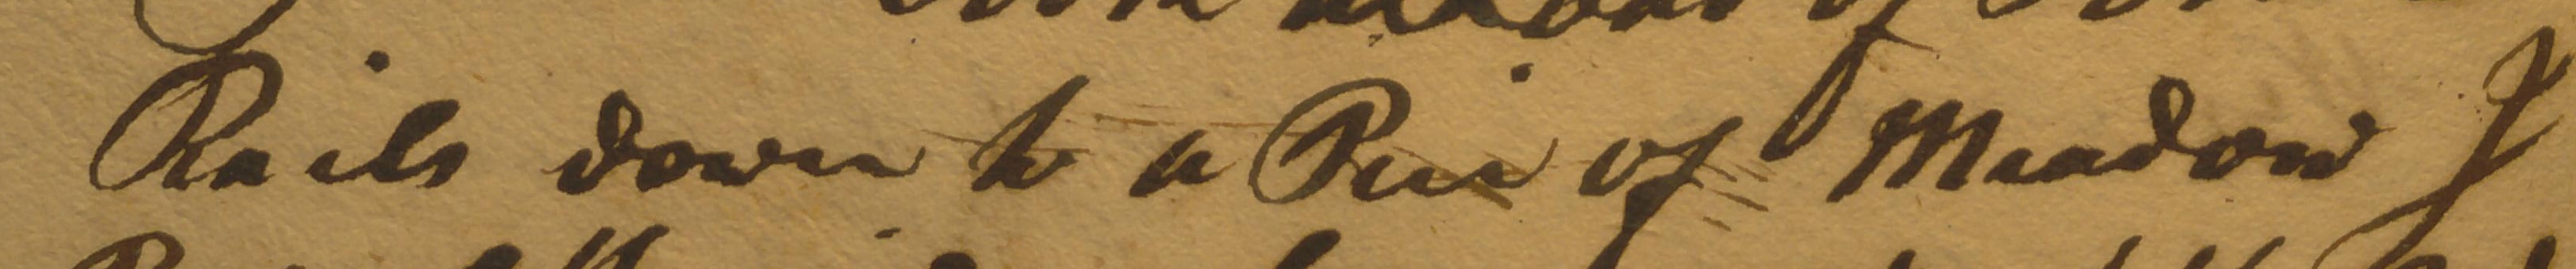Rails down to a Pice of Meadow I
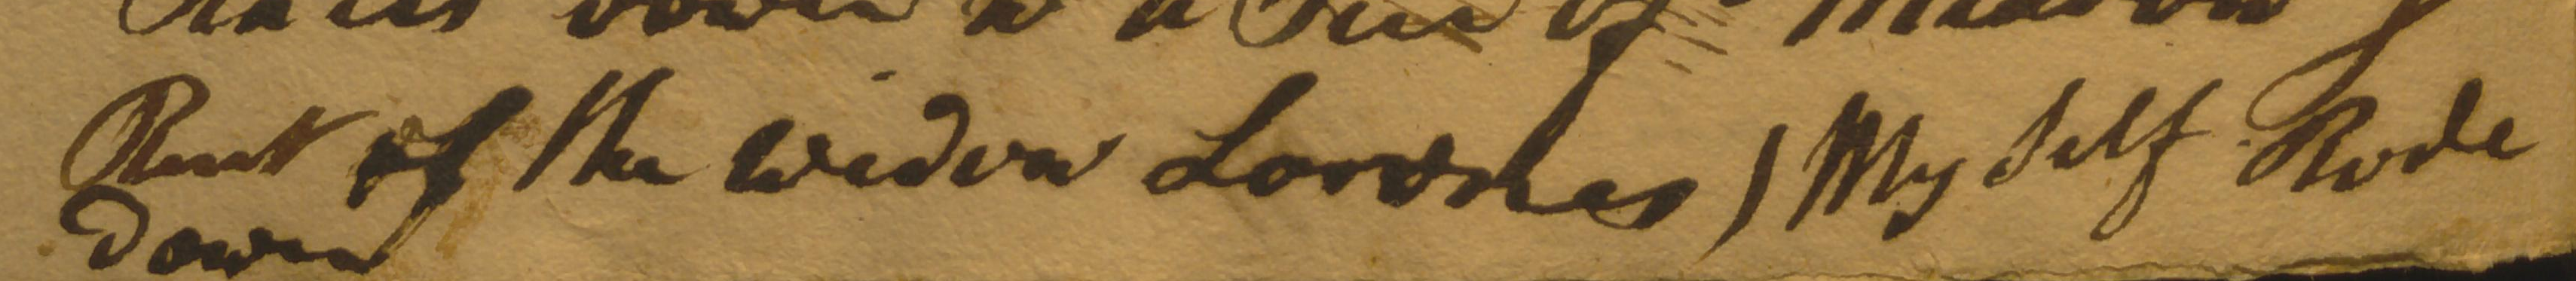Rent of the widow Lowres) My self Rode
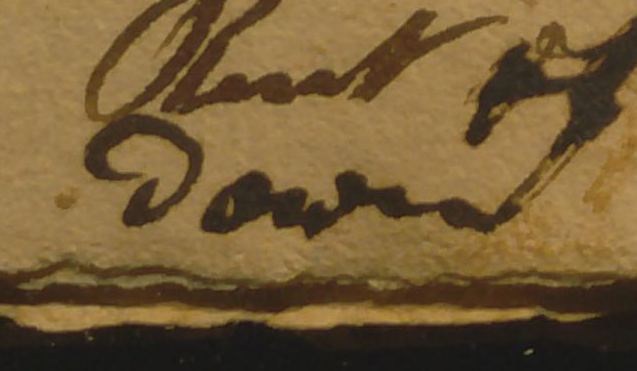down
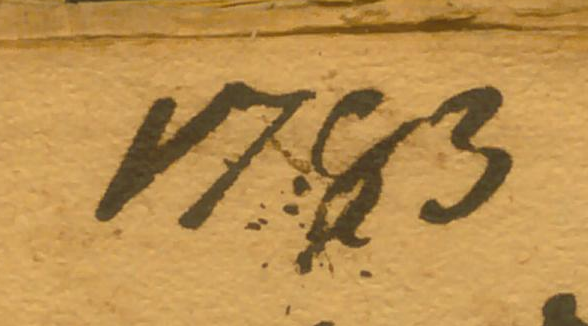1783
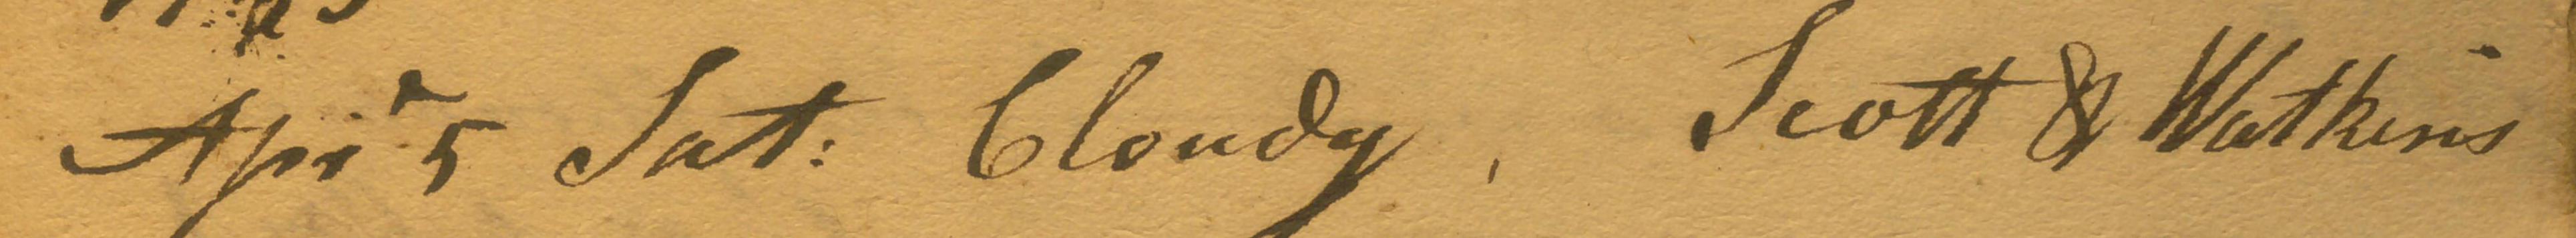Apr^l. 5 Sat. Cloudy, Scott & Watkins
